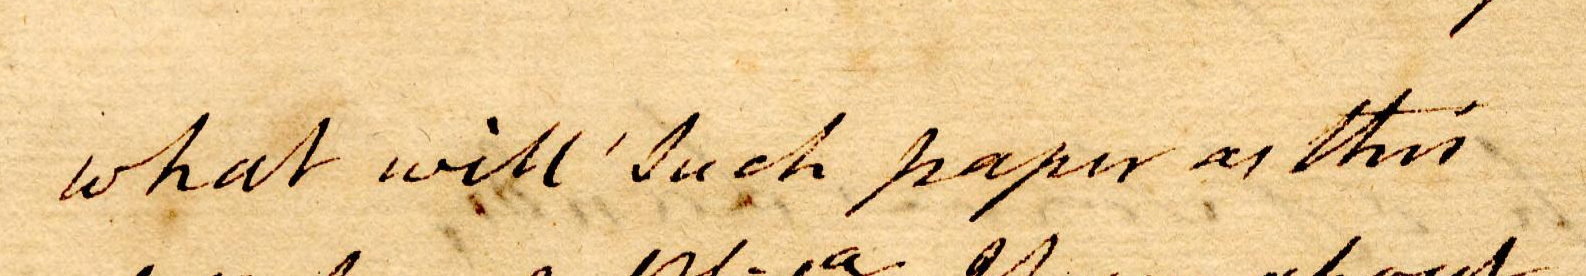what will such paper as this
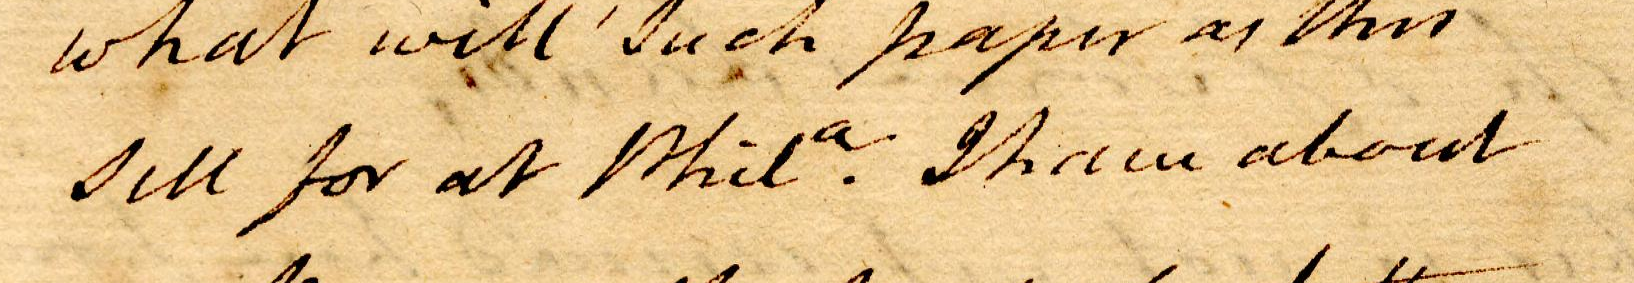sell for at Phil^a. I have about
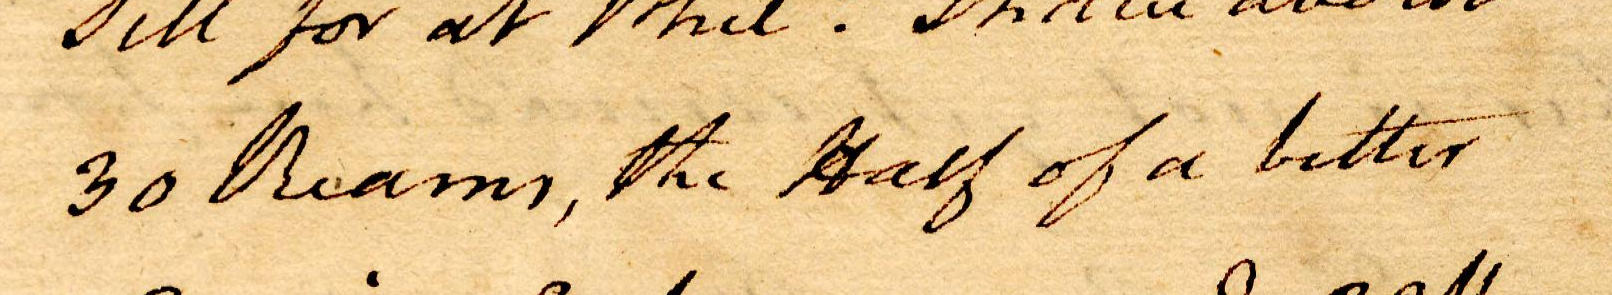3o Reams, the Half of a better
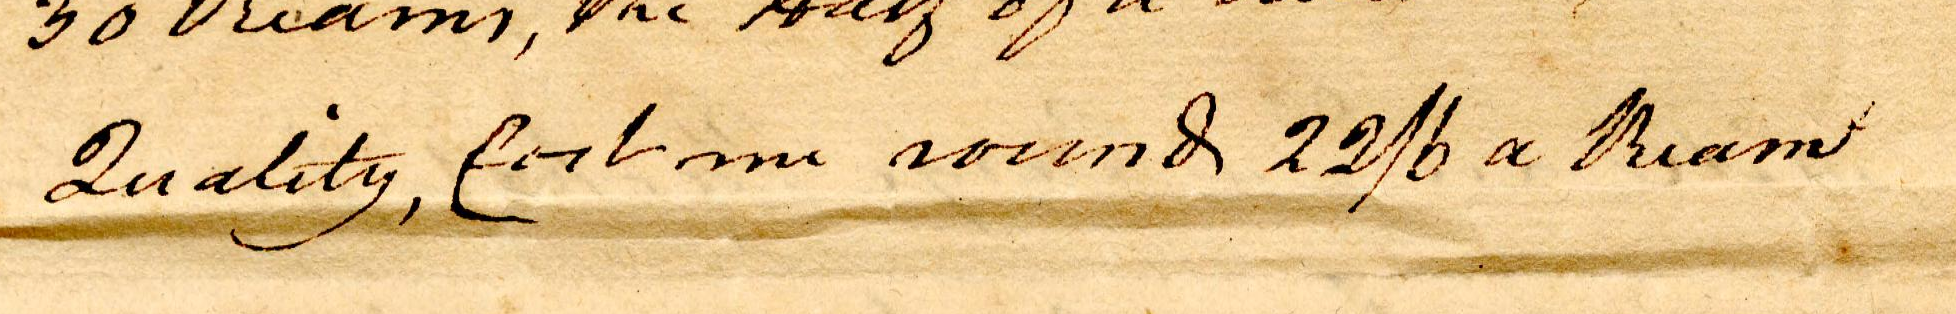Quality, Cost me round 23sb a Ream
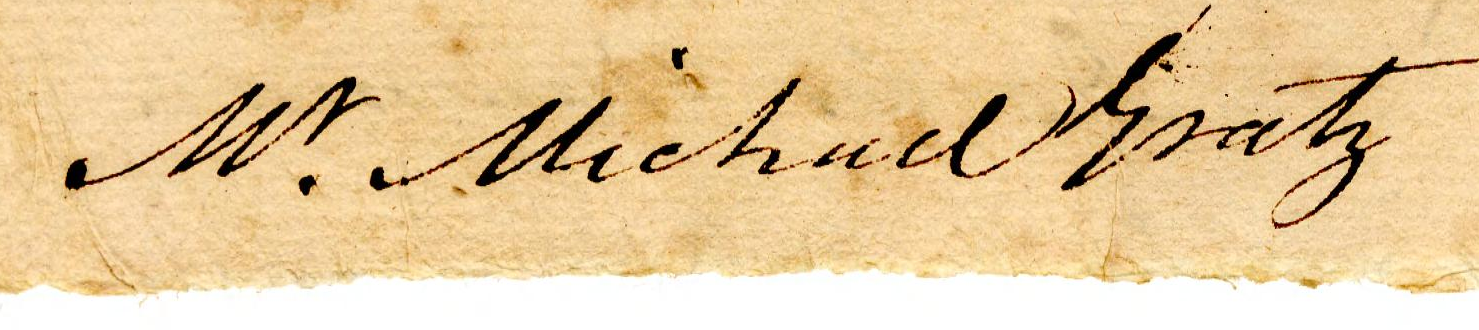M^r. Michael Gratz
